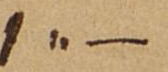1 .. -
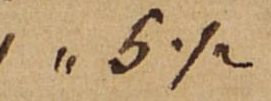1 .. 5 1/2
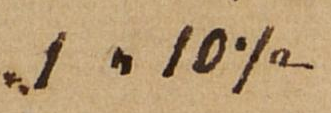1 .. 10 1/2
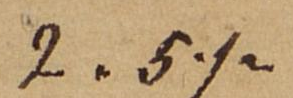2 . 5 1/2
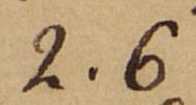2.6
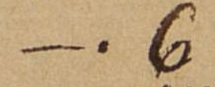9 . -
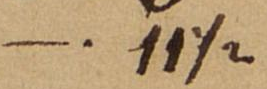- . 11 1/2
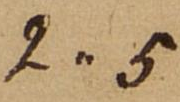2 ..5
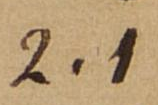2.1
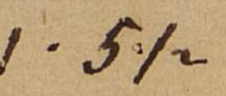1 . 5 1/2
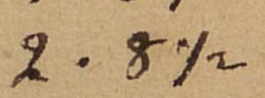2 . 8 1/2
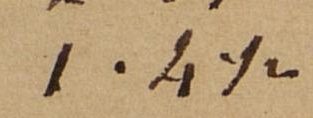1 . 4 1/2
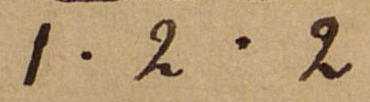1 . 2 . 2
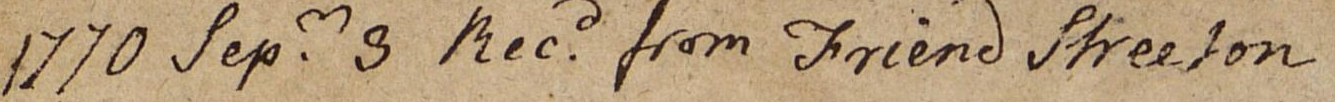1770 Sep^m. 3 Rec^d. from Friend Streeton
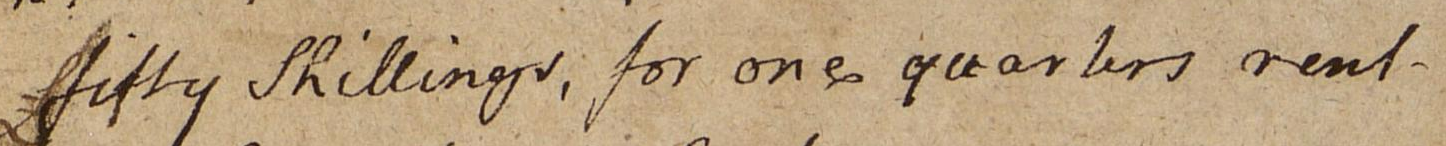fifty Shillings, for one quarters rent-
